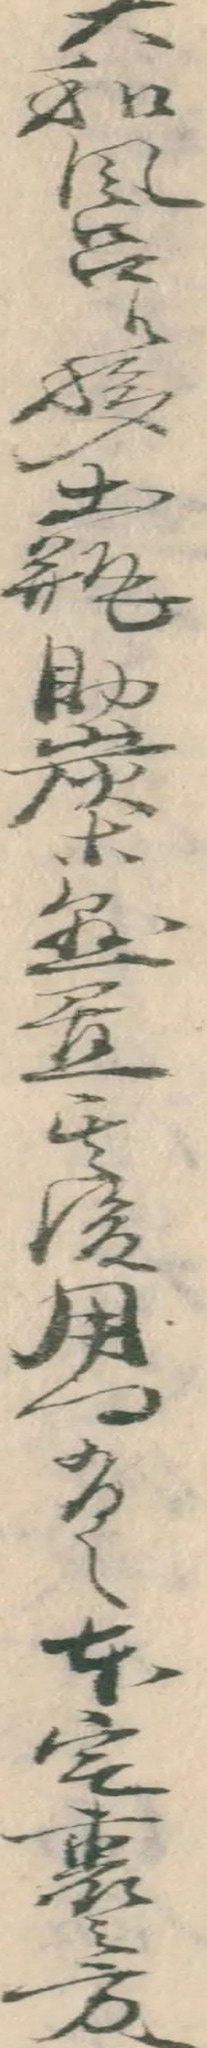大和風呂え移土瓶助炭等置其後用向有之本宅裏之方え
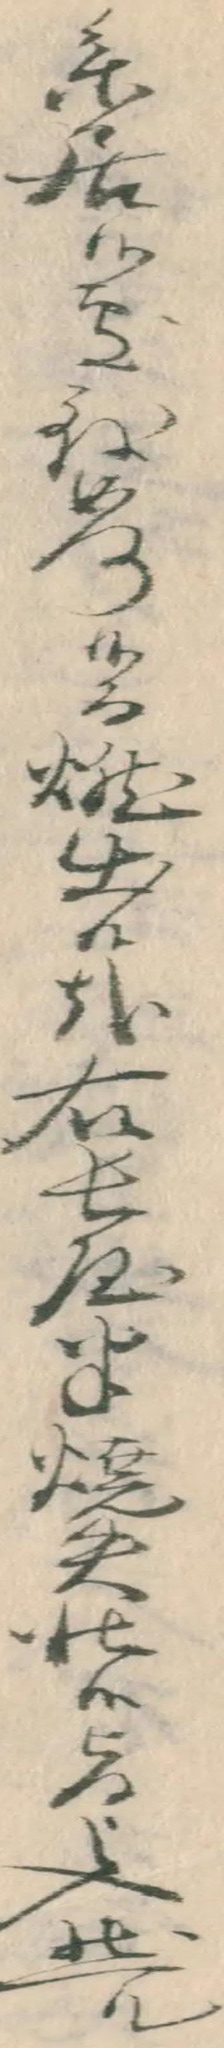参居候處致如何候而燃出候哉右長屋半焼失仕候旨被入然ル
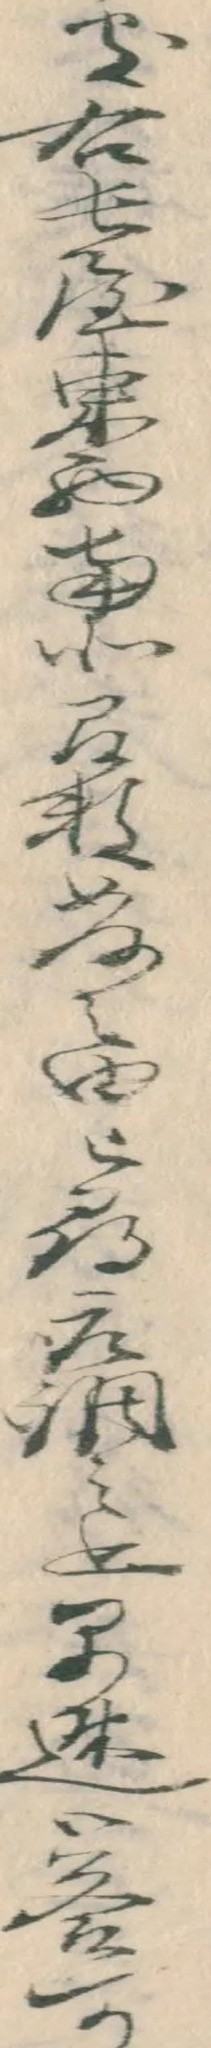處右長屋東西南北間数如何之由被尋取調之上早速御答可
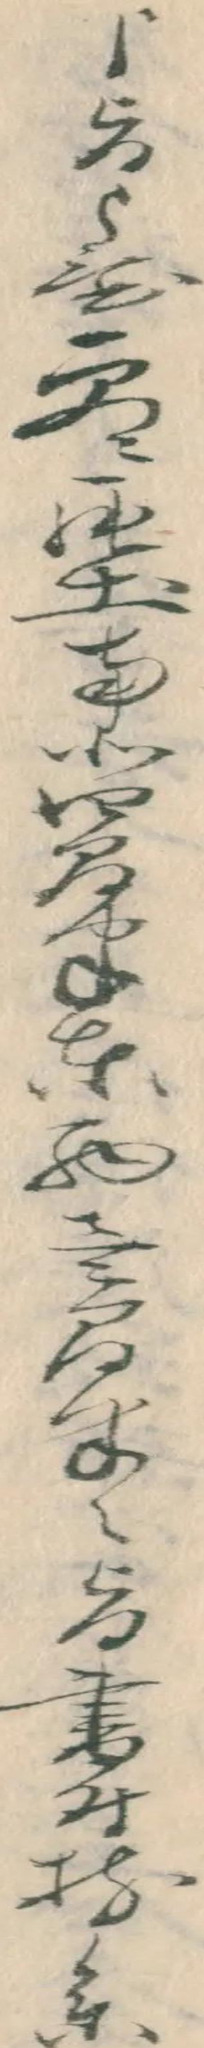申旨被遣更ニ罷出南北四間半東西壱間半之旨書付持参
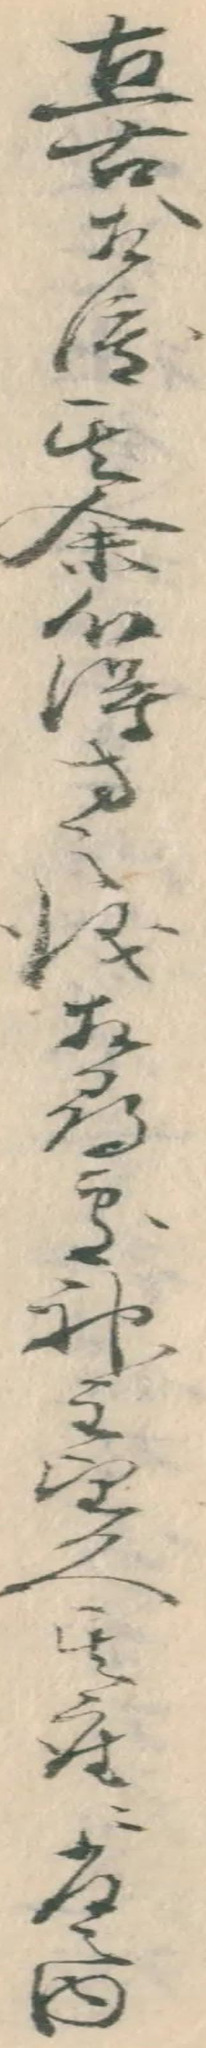直古へ相渡其余心得方之儀相尋處神主望久其座に有之内
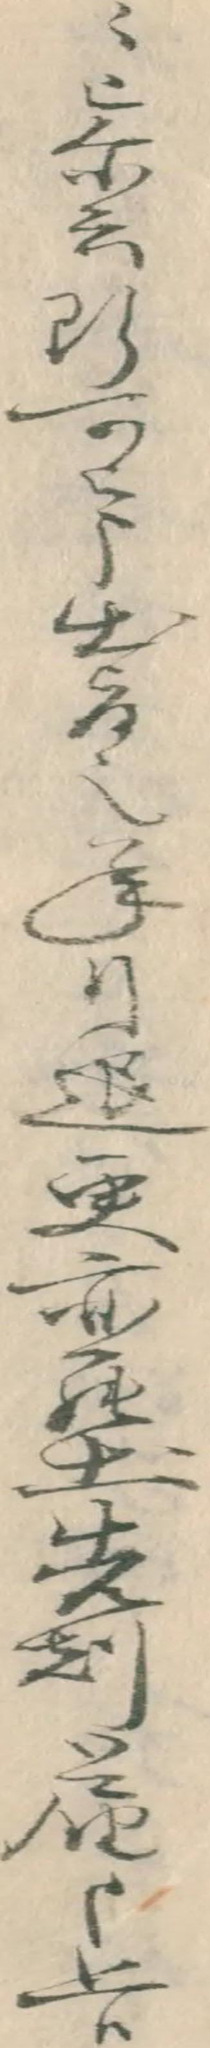々被示云断可被申出旨也承引退更亦罷出先刻御届申上候
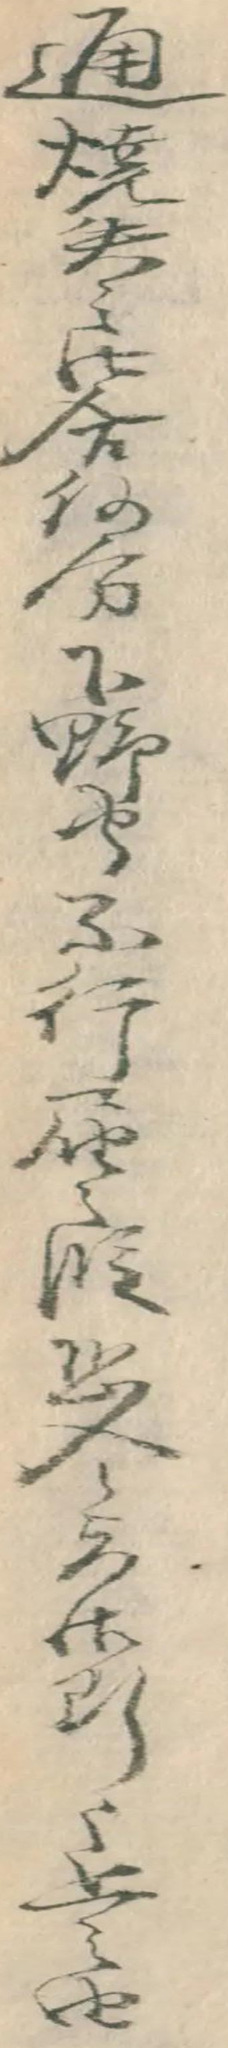通焼失候仕由合何分下野守不行届之段恐入候旨御断申上之由

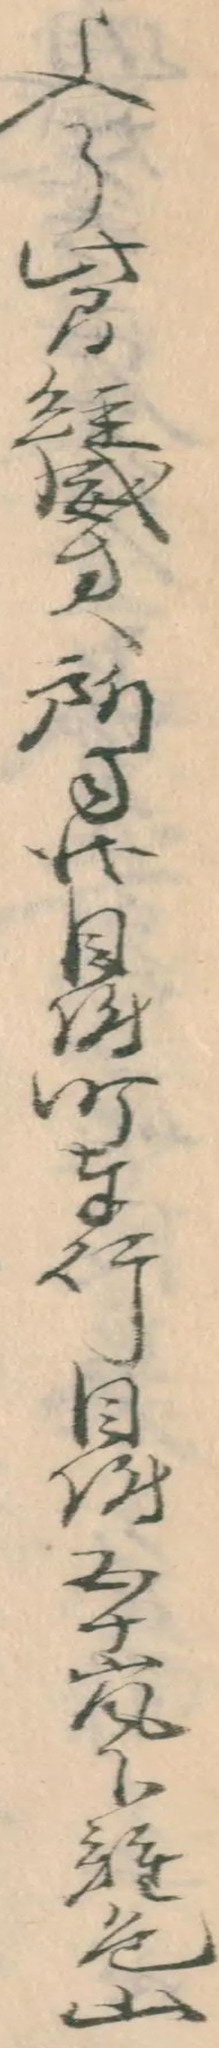申入了此間経威方へ所司代目附町奉行目附五十嵐下雑色山
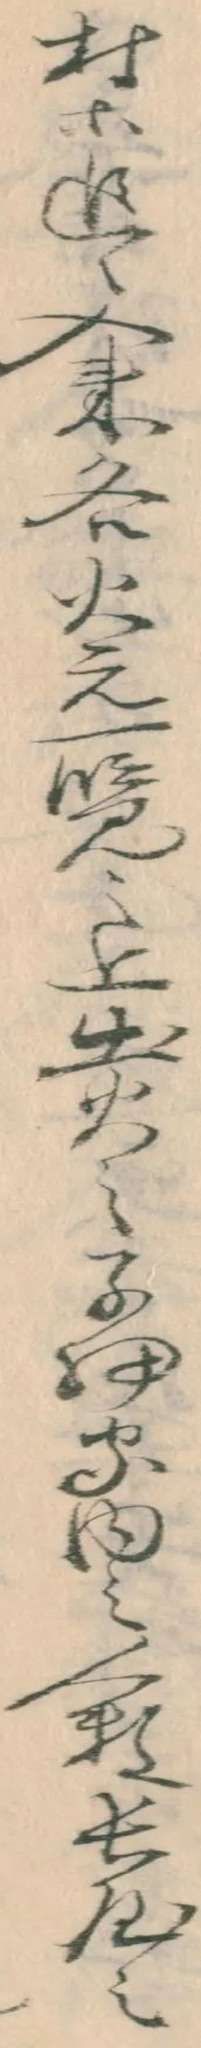村等追々入来各火元一覧之上出火之子細家内之人数長屋之
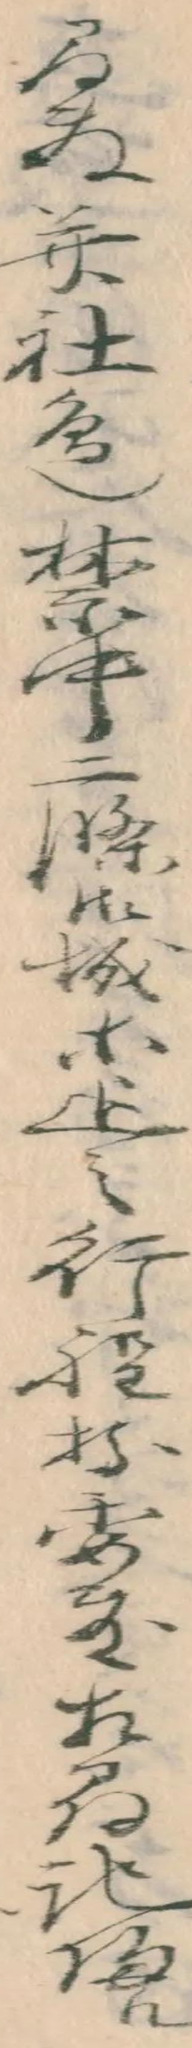間敷并社邊禁中二條御城等迄之行程抔委敷相尋記帰ル
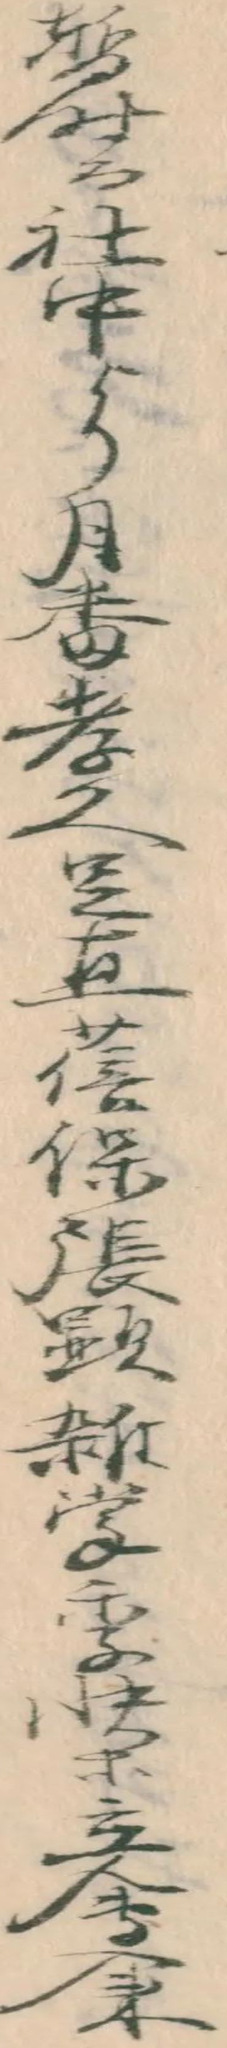暫時而社中より月番孝久足直蓓保張顕雑掌季快等立會入来
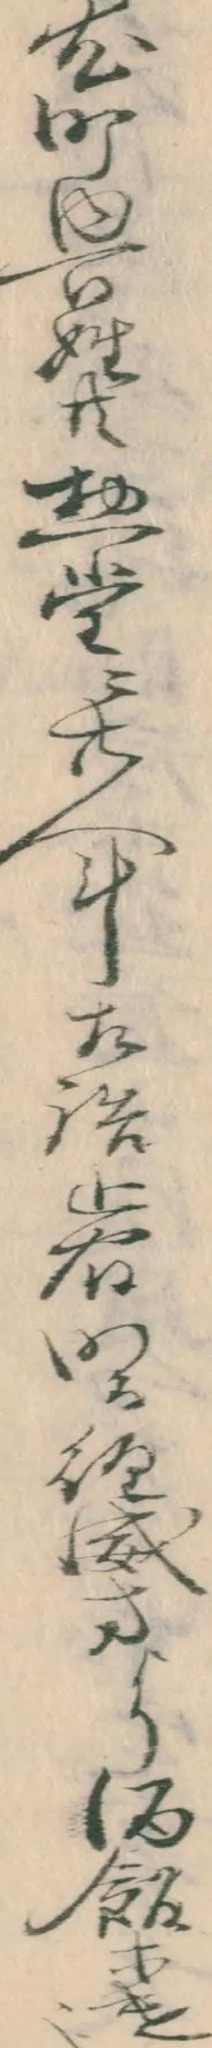尤町内百姓共惣堂ニ廿人斗相詰止有仍而経威方より酒飯等遣也
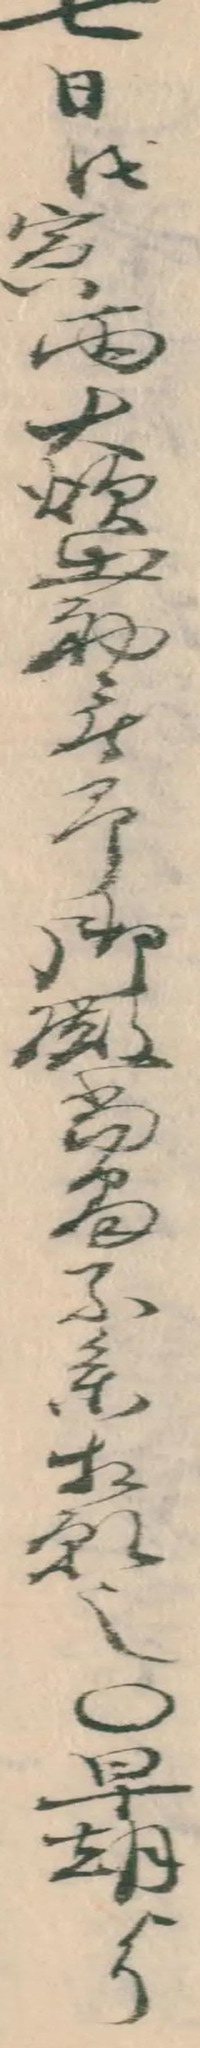七日戊寅雨大炊出勤ニ付予御殿當番不参相願之○早朝より
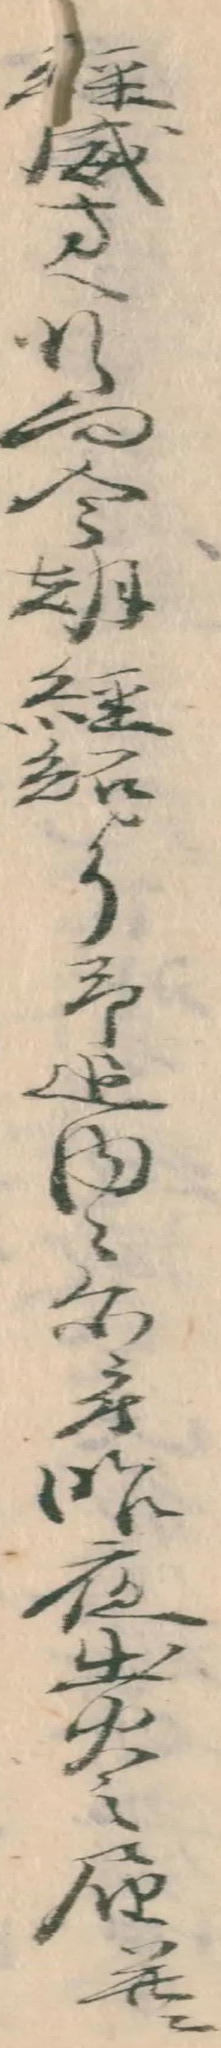経威方へ行向今朝経紹より予迄内々爾に付昨夜出火之届幷ニ
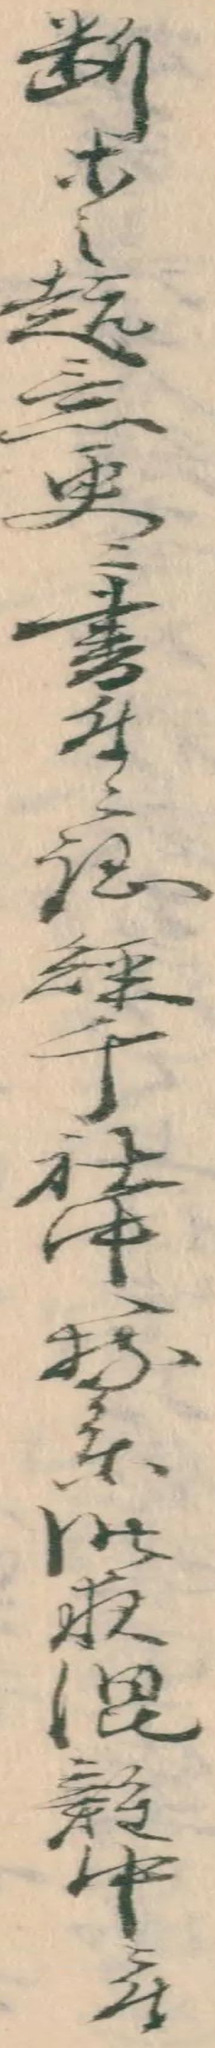断等之趣意更に書付ニ記経千社中へ持参此夜混雑中ニ付
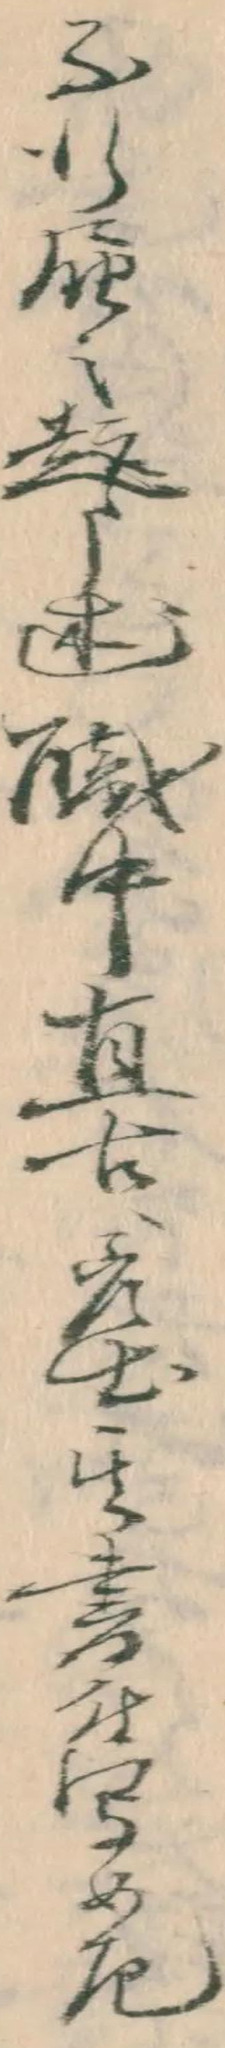不行届之趣申述職中直古へ差出其書付写如左
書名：賀茂社記録. 第66冊
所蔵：国立国会図書館 National Diet Library, JAPAN
